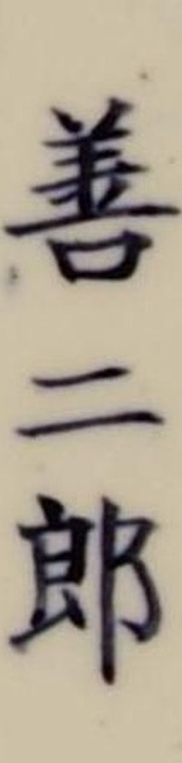善二郎
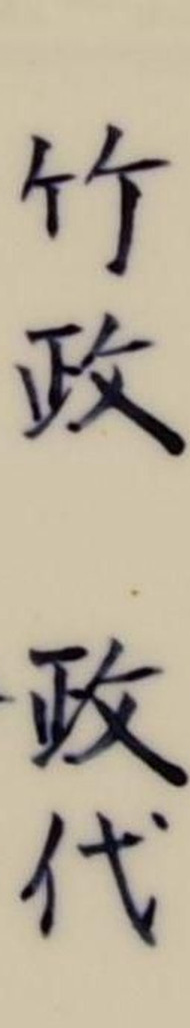竹政政代
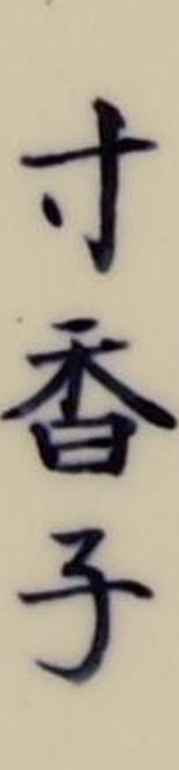寸香子
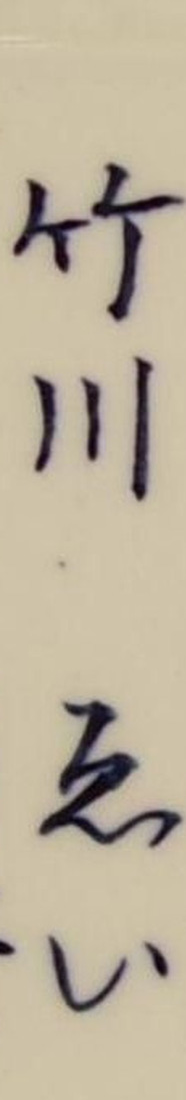竹川ゑい
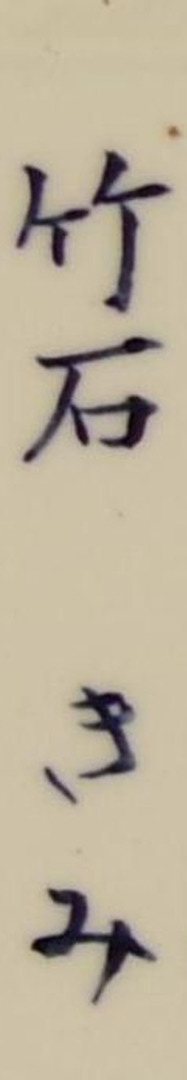竹石きみ
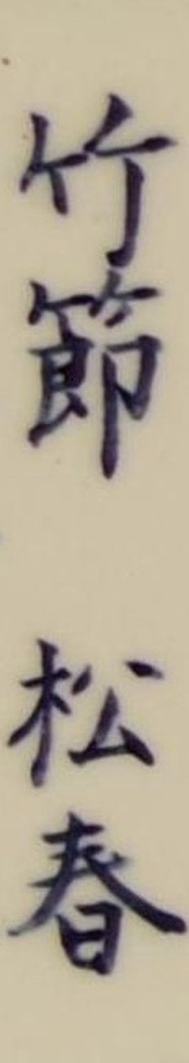竹節松春
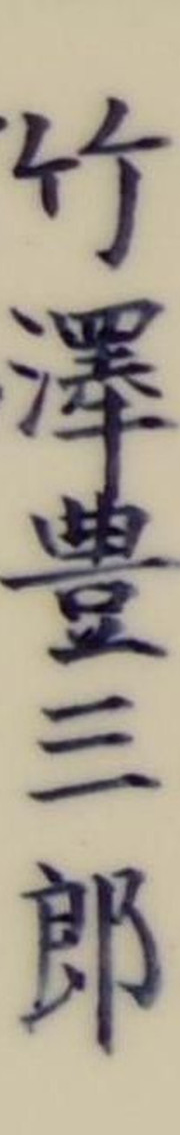竹澤豊三郎
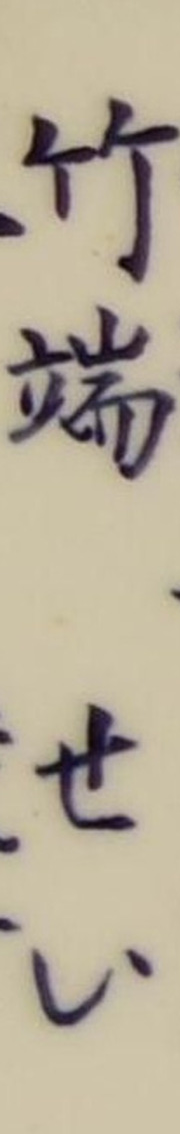竹端せい
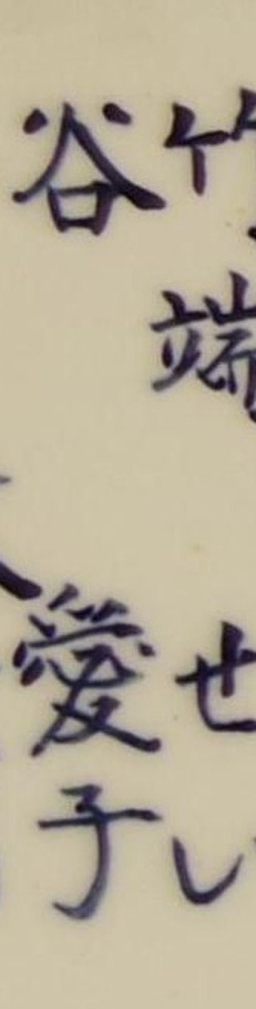谷愛子
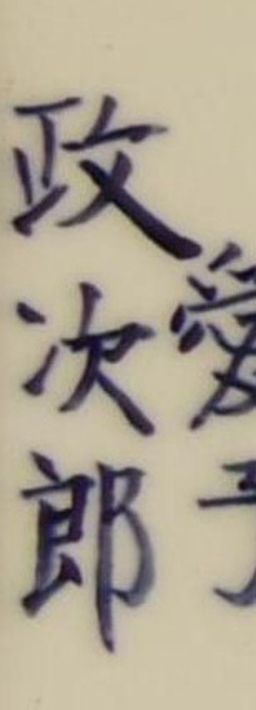政次郎

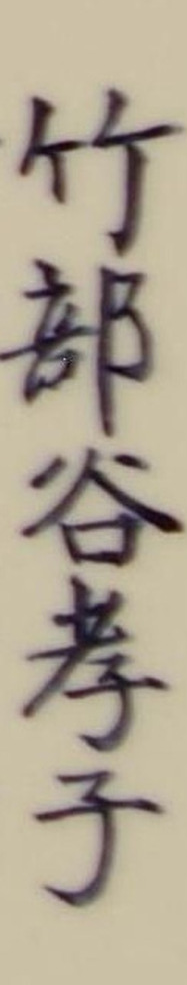竹部谷孝子
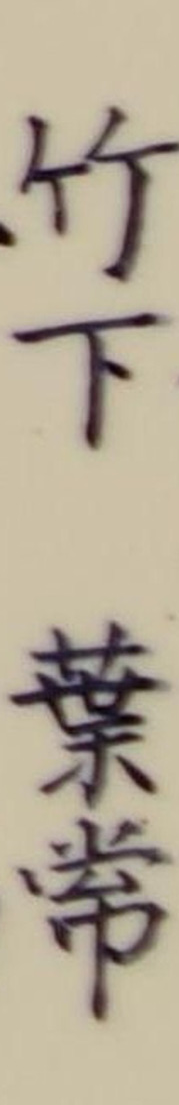竹下葉常
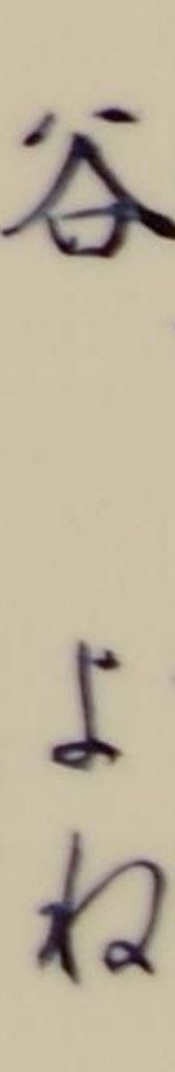谷よね
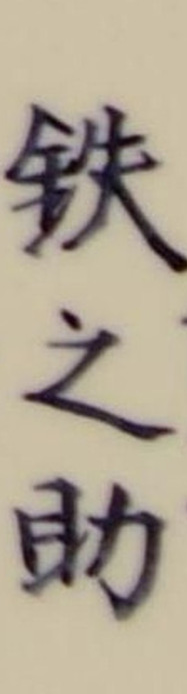鉄之助
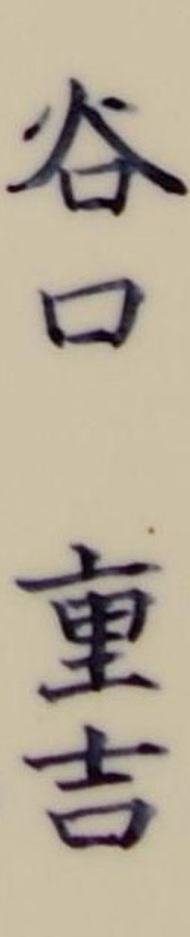谷口重吉
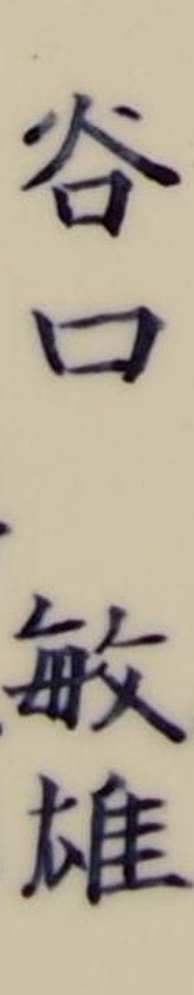谷口敏雄
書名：A~D
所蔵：koyasan kongobuji
